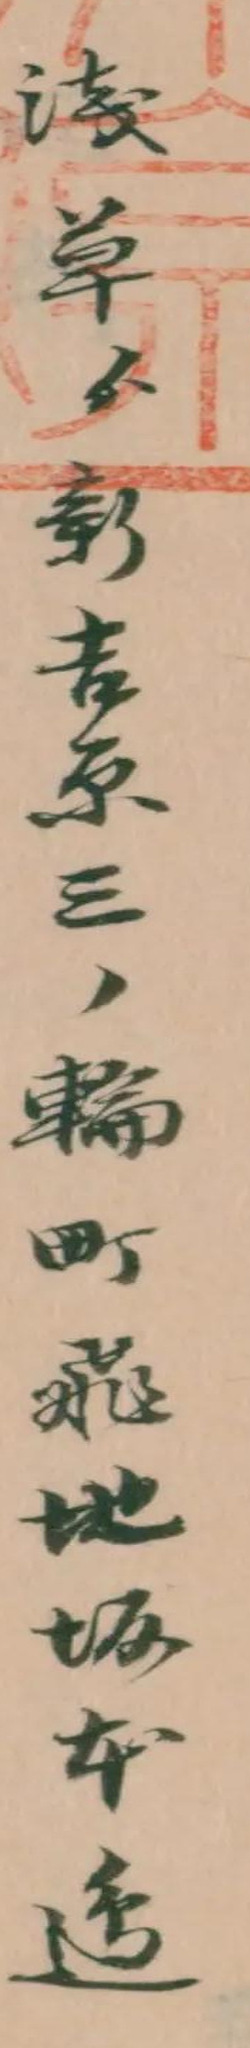浅草ゟ新吉原三ノ輪町飛地坂本辺
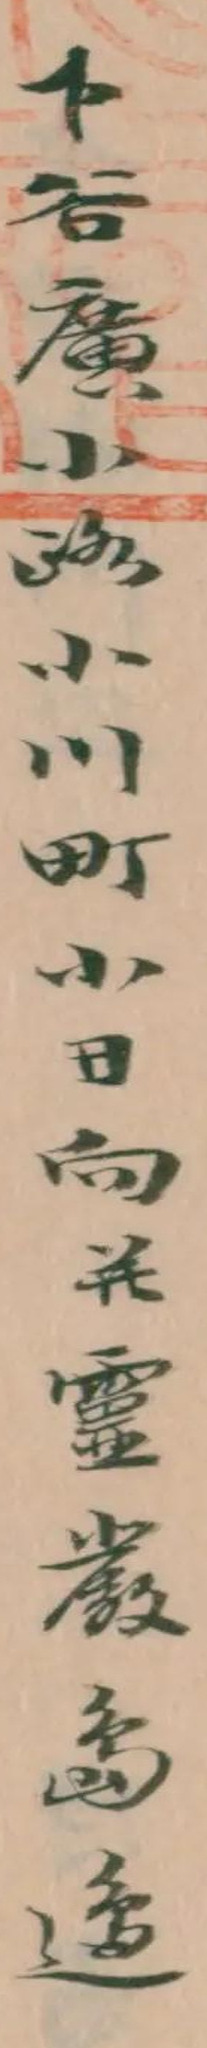下谷広小路小川町小日向并霊巖島辺
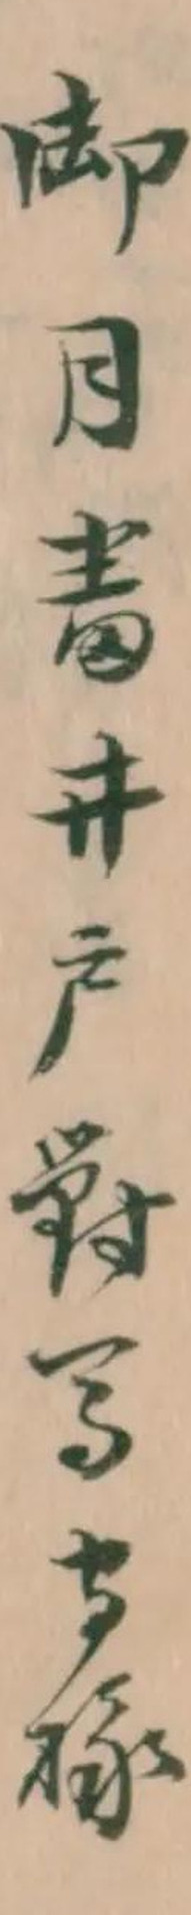御月番井戸対馬守様
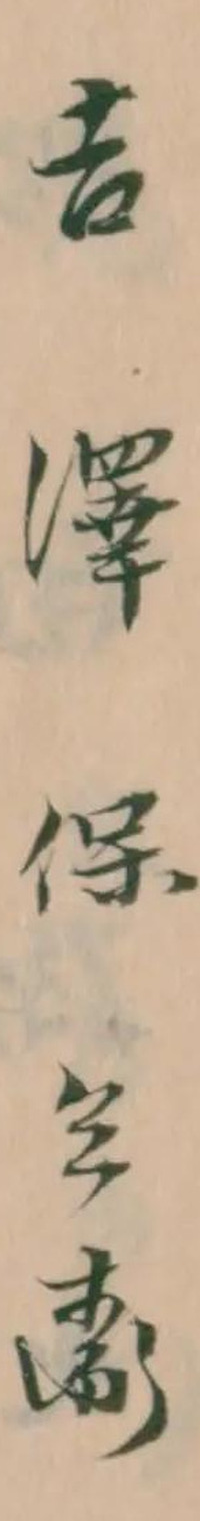吉沢保兵衛
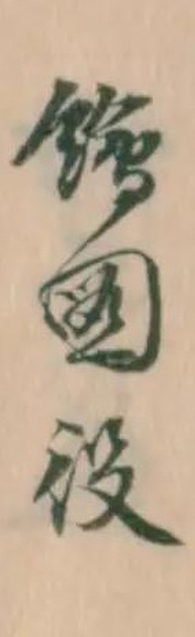絵図役
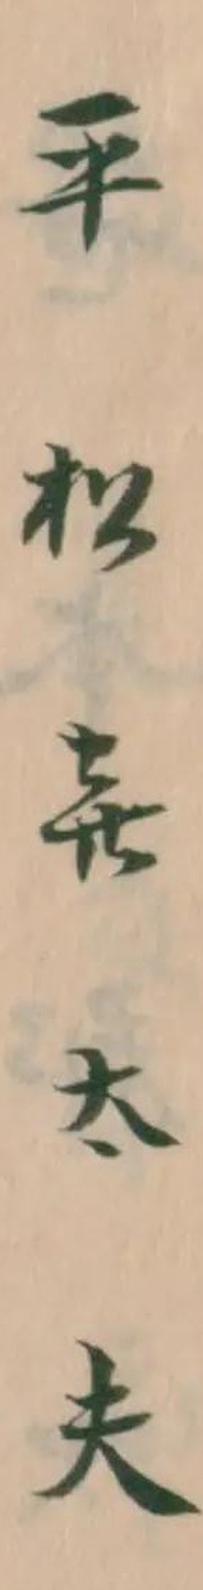平松喜太夫
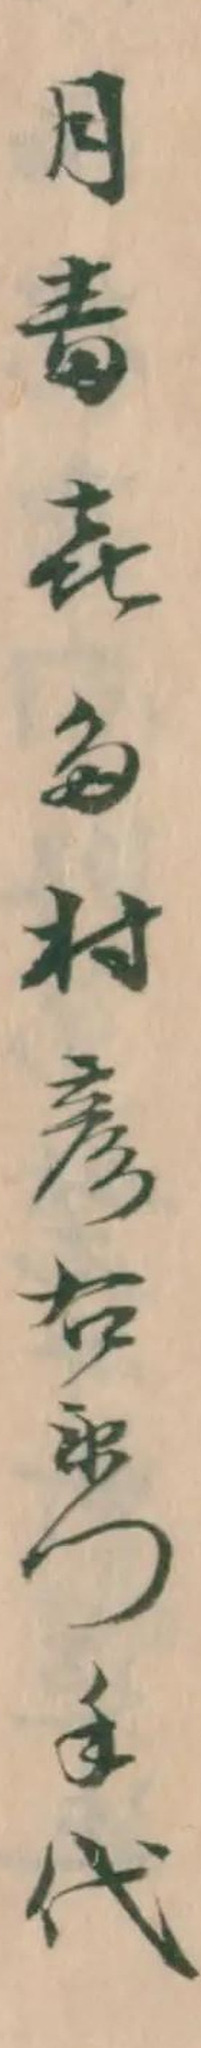月番喜多村彦右衛門手代
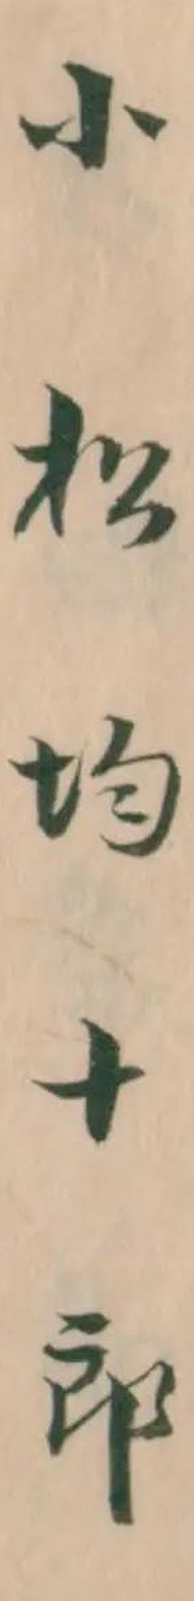小松均十郎
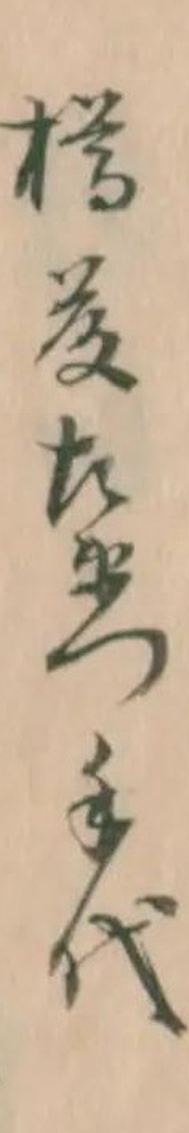樽藤左衛門手代
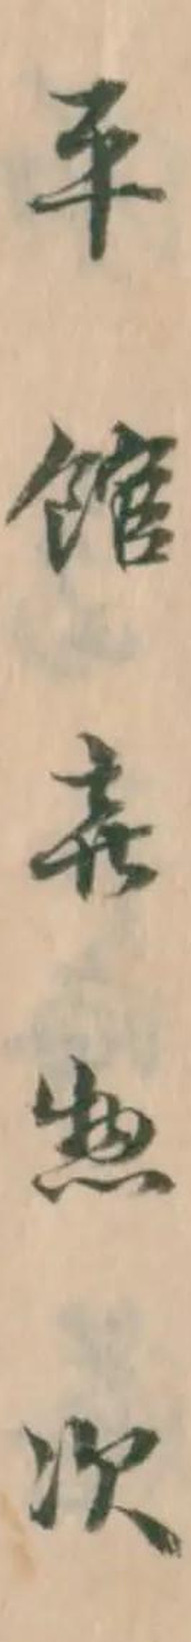平館喜惣次

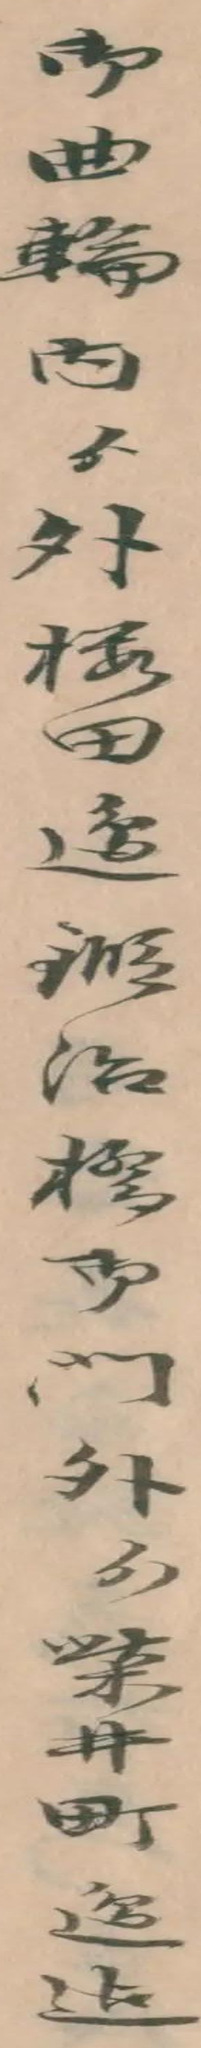御曲輪内ゟ外桜田辺鍛冶橋御門外ゟ柴井町辺迄
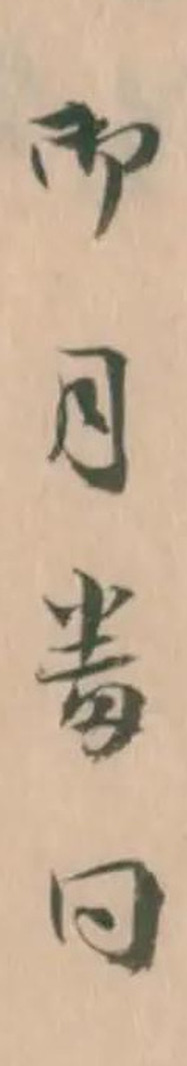御月番同
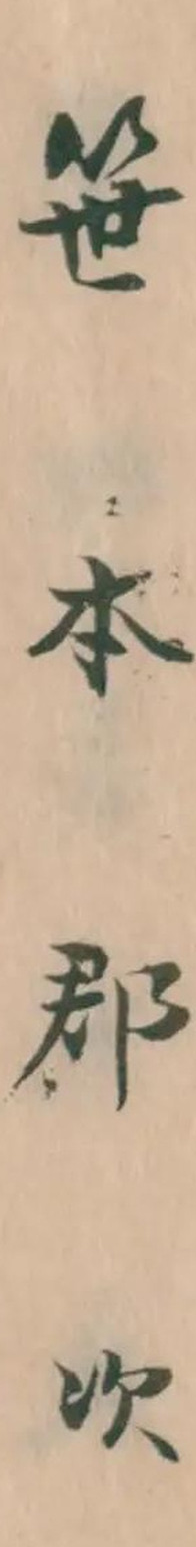笹本郡次
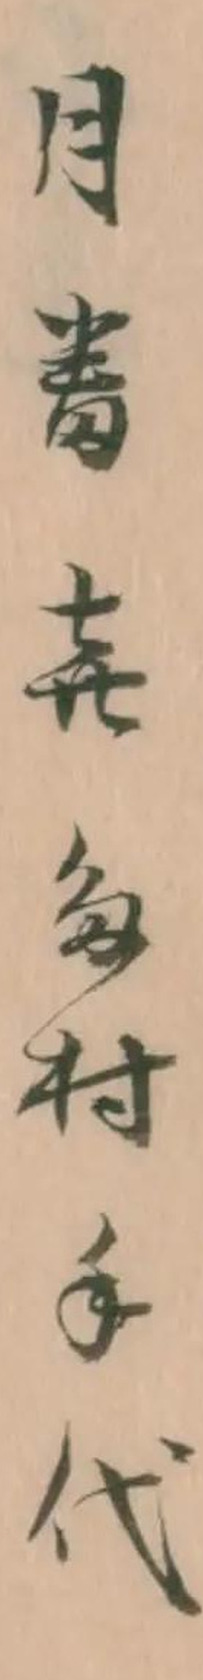月番喜多村手代
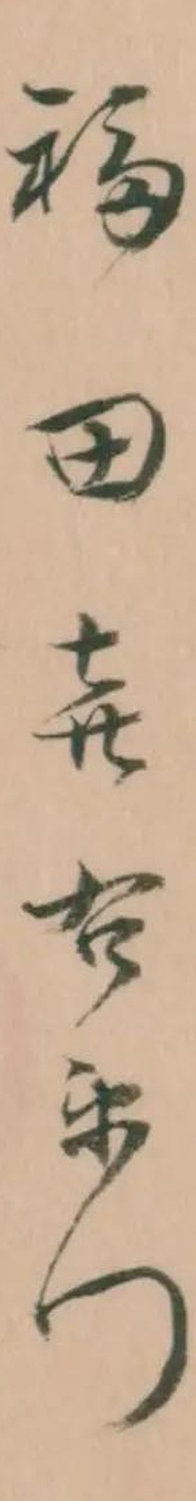福田喜右衛門
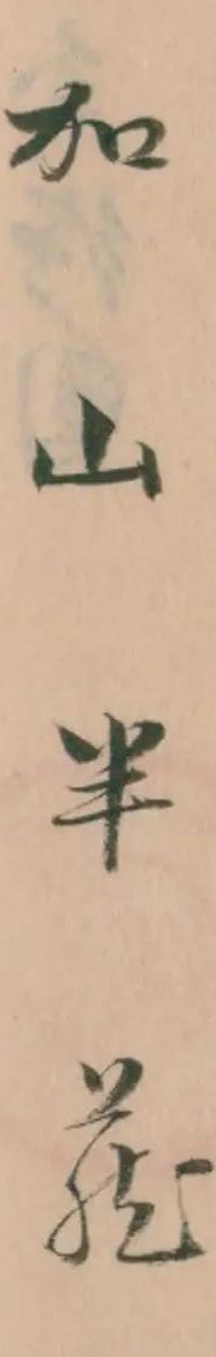加山半蔵
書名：地災撮要. 巻7-9(地震之部)
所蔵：国立国会図書館 National Diet Library, JAPAN
